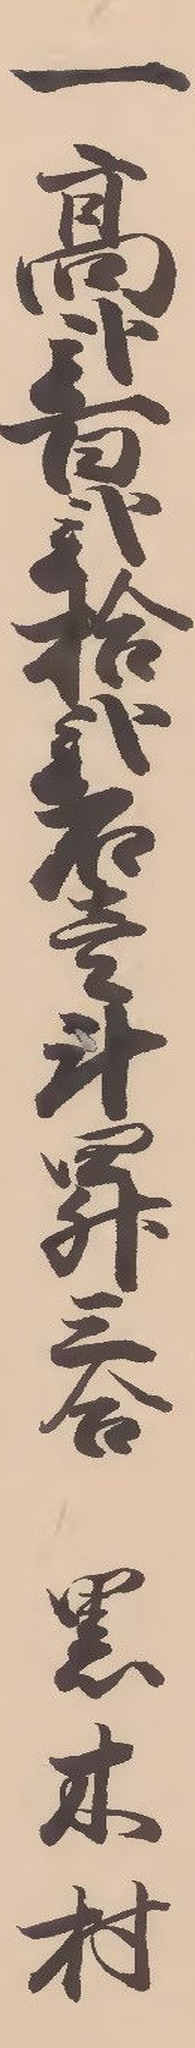一高弐百弐拾弐石壱斗四升三合黒木村
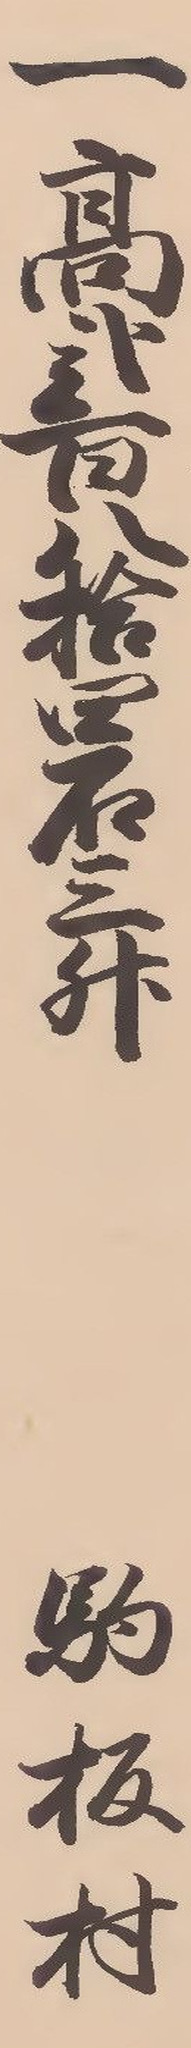一高弐百八拾四石三升駒板村
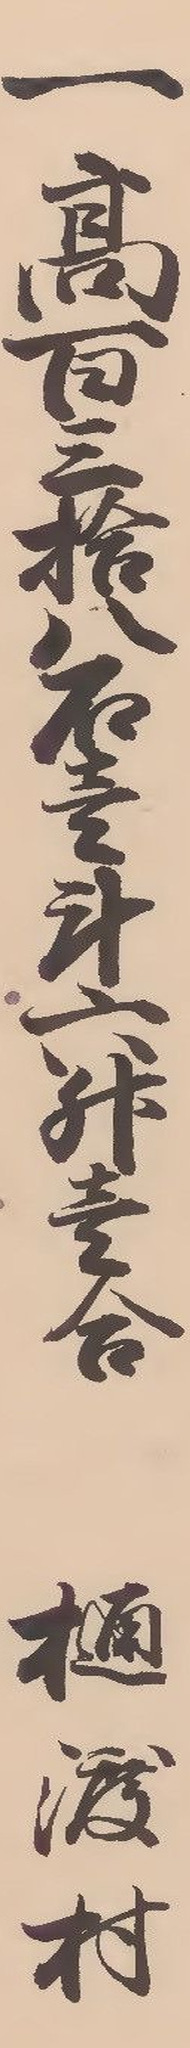一高百三拾八石壱斗六升壱合樋渡村

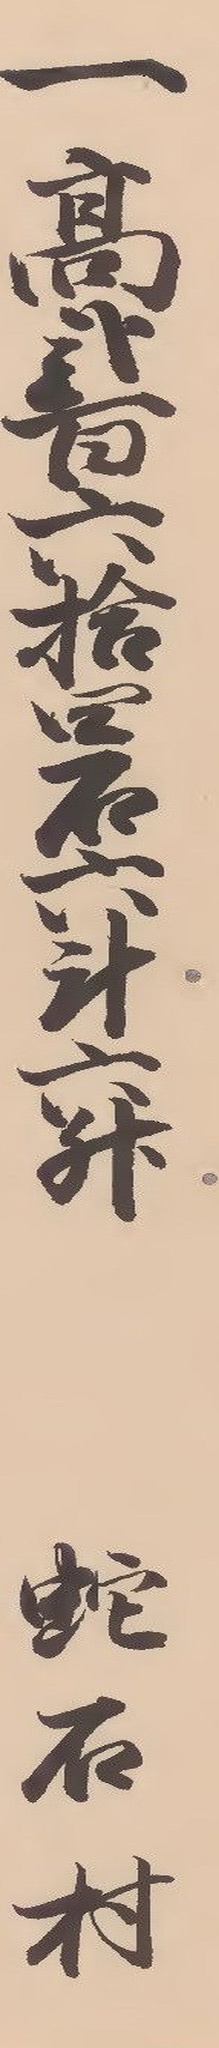一高弐百六拾四石六斗六升蛇石村
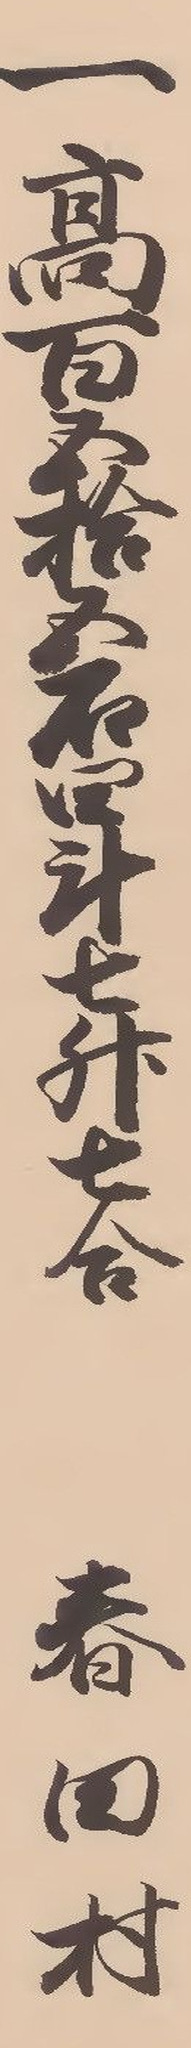一高百五拾五石四斗七升七合春田村
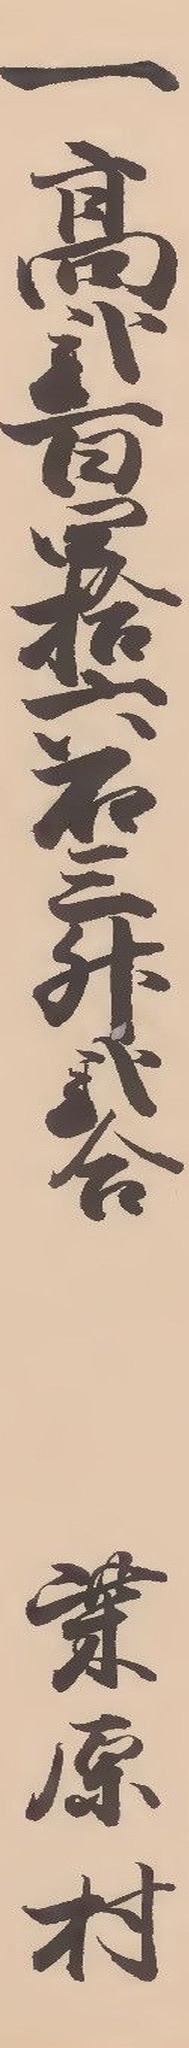一高弐百四拾六石三升弐合柴原村
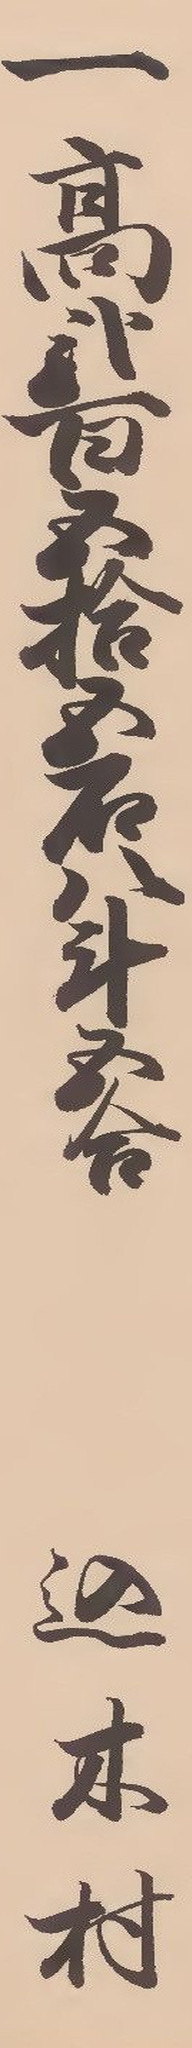一高弐百五拾五石八斗五合込木村
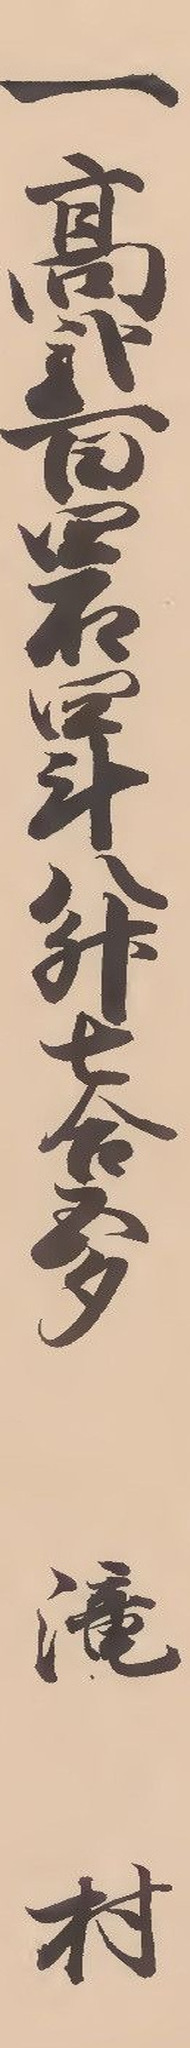一高弐百四石四斗八升七合五勺滝村
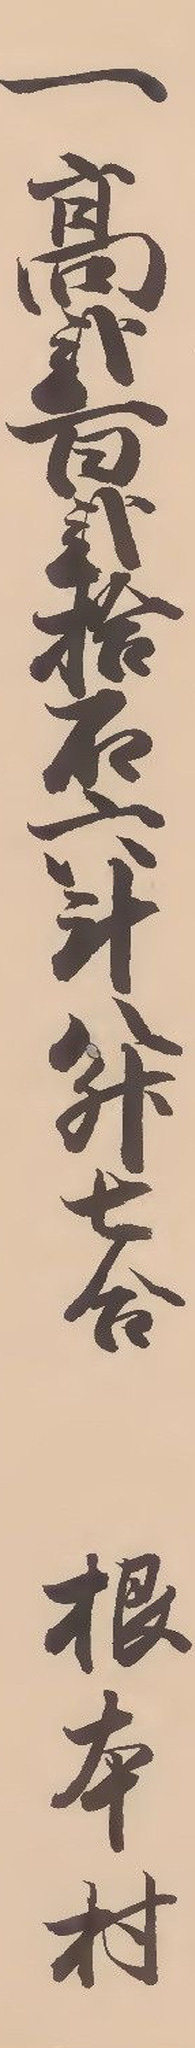一高弐百弐拾石六斗八升七合根本村
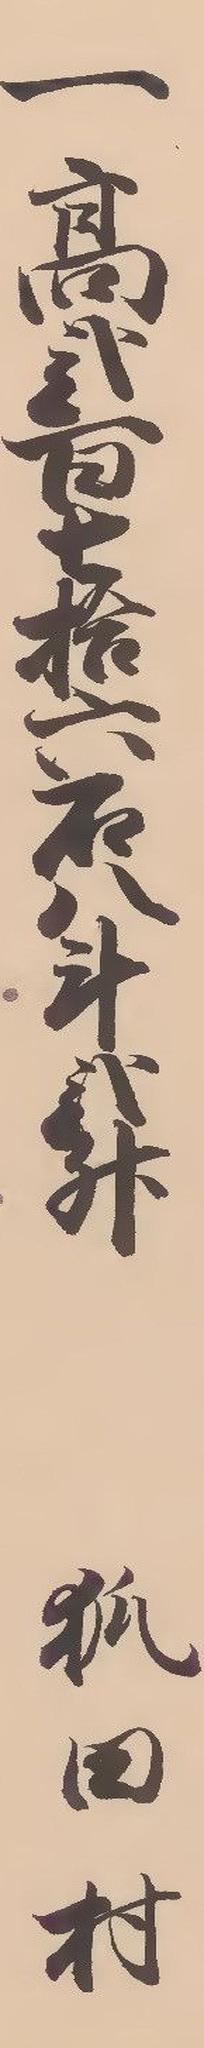一高弐百七拾六石八斗弐升狐田村

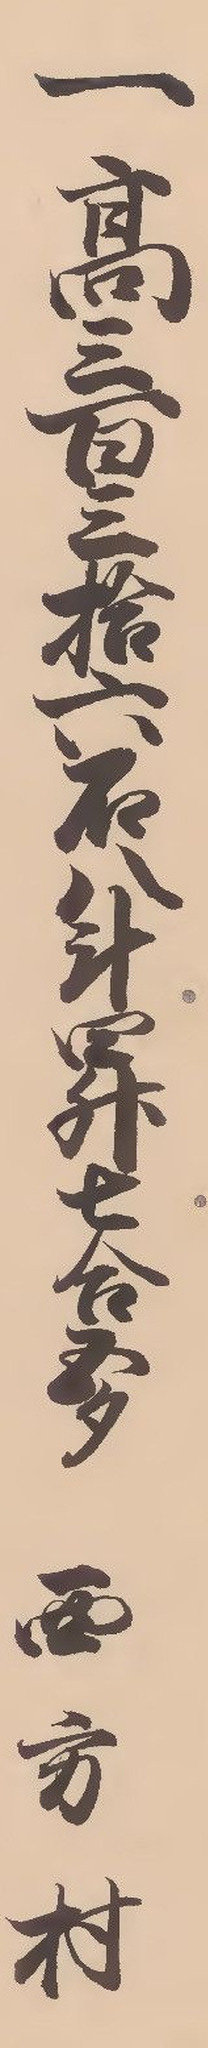一高三百三拾六石八斗四升七合五勺西方村
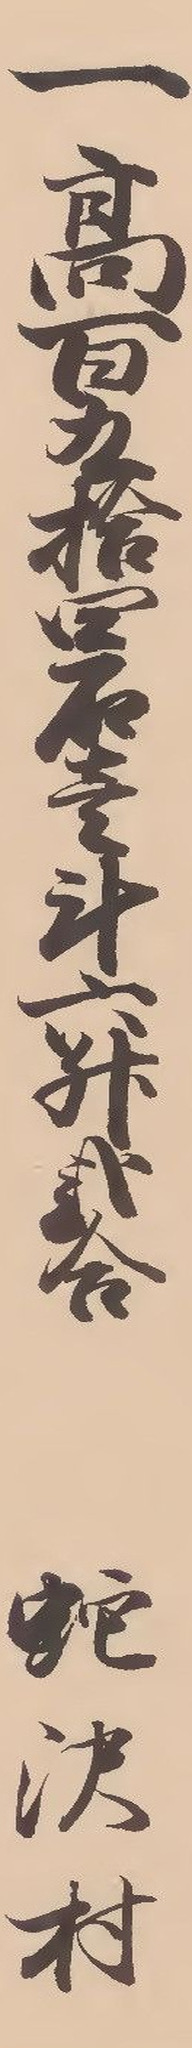一高百九拾四石壱斗六升弐合蛇沢村
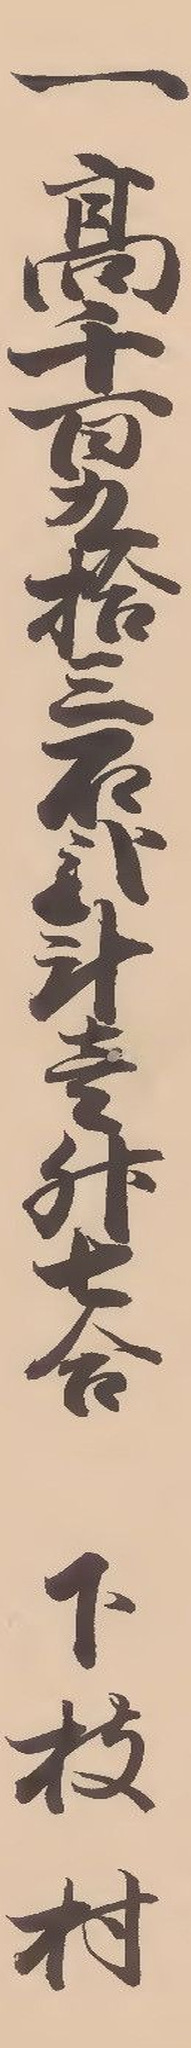一高千百九拾三石弐斗壱升七合下枝村
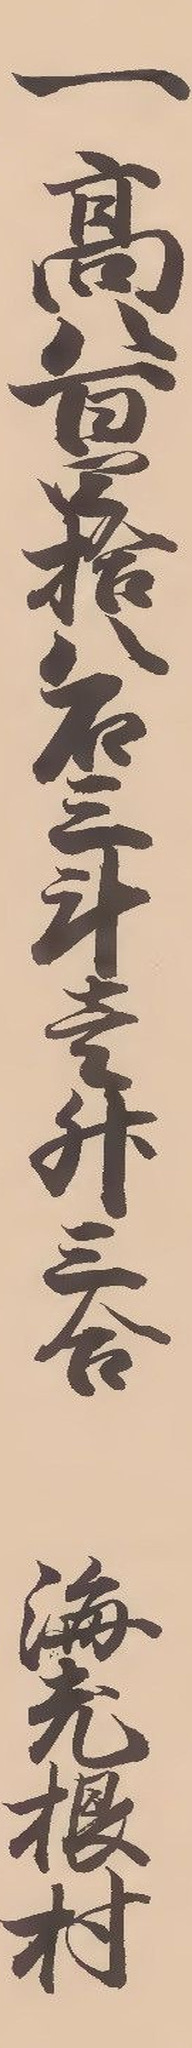一高八百四拾八石三斗壱升三合海老根村
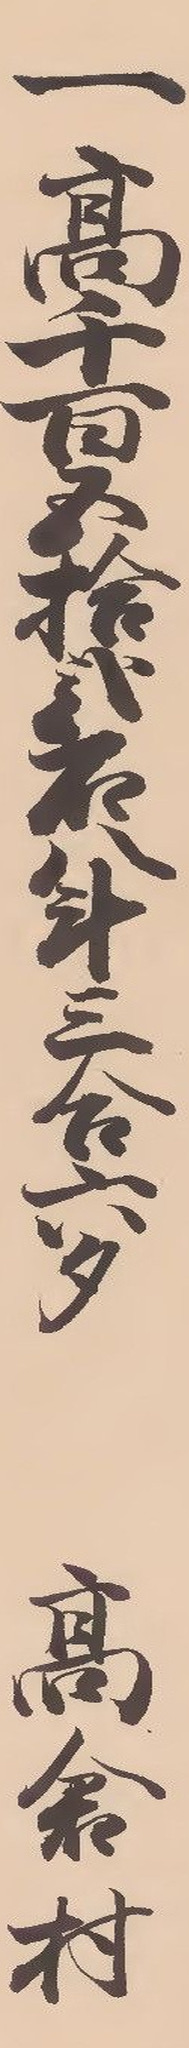一高千百五拾弐石八斗三合六勺高倉村
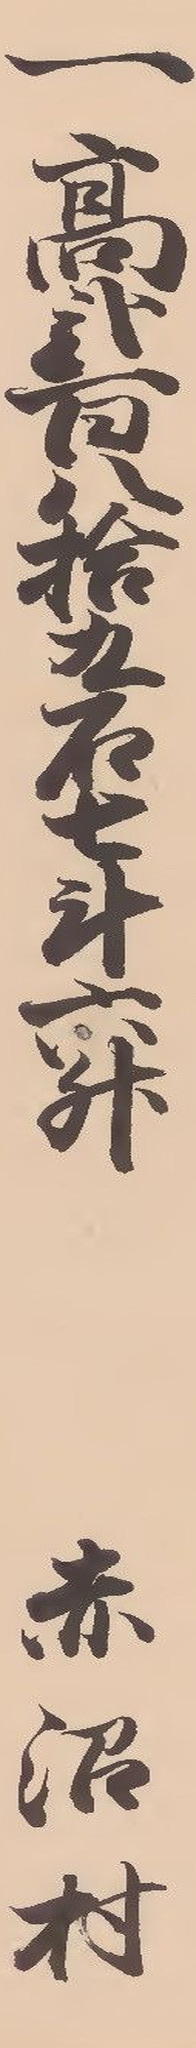一高弐百八拾九石七斗六升赤沼村
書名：陸奥国郷帳　２
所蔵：国立公文書館 National Archives of Japan
